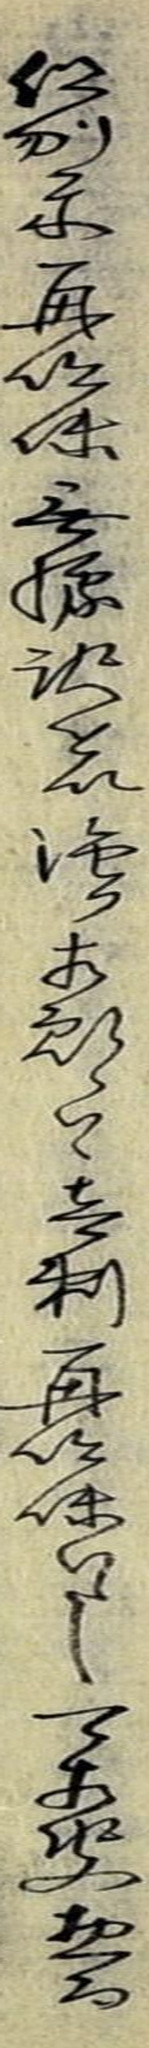但刎米再吟味無拠訳を以強く相願候はヽ壱刺再吟味いたし可相決惣而
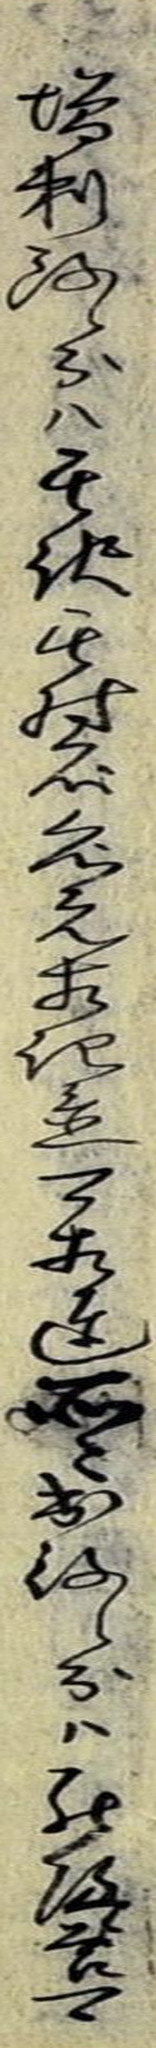増刺致候分は其訳其村名名元相記置可相達所々出致候分は罷帰候節可
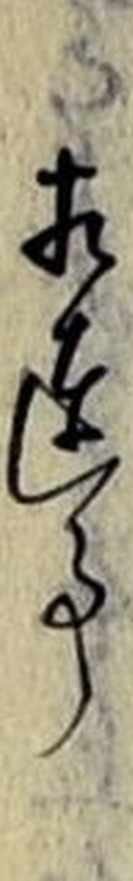相達事
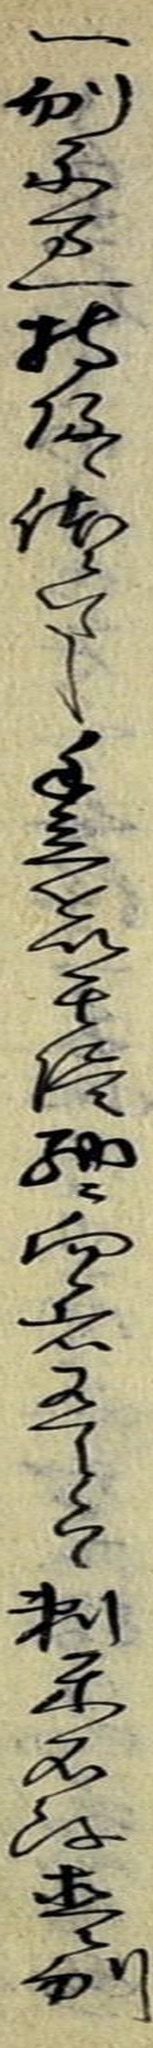一刎米万一持帰候体にいたし手立を以其侭納に向候者有之候はヽ刺米不致直々刎
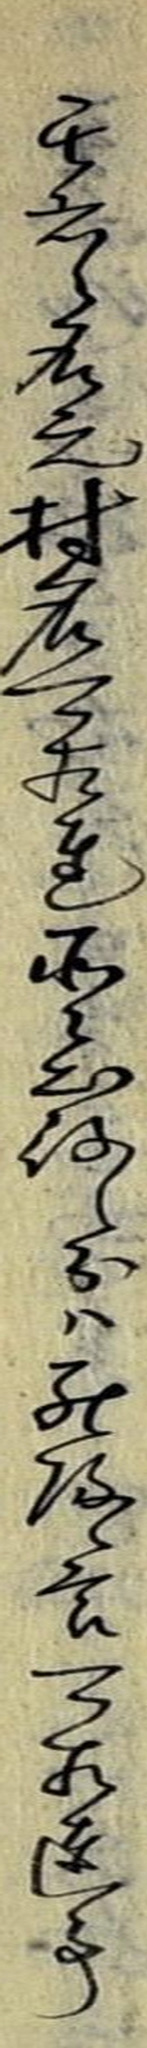其者之名元村名可相達所々出致候分は罷帰候節可相達事
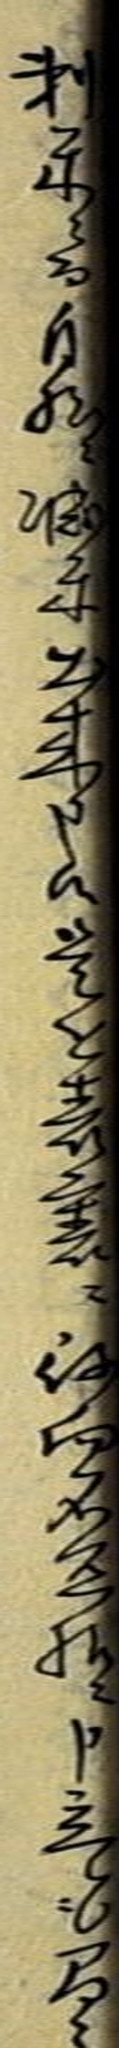刺米に而自然に減米出来申候是を表裏に役向不宜様に申立候も間々
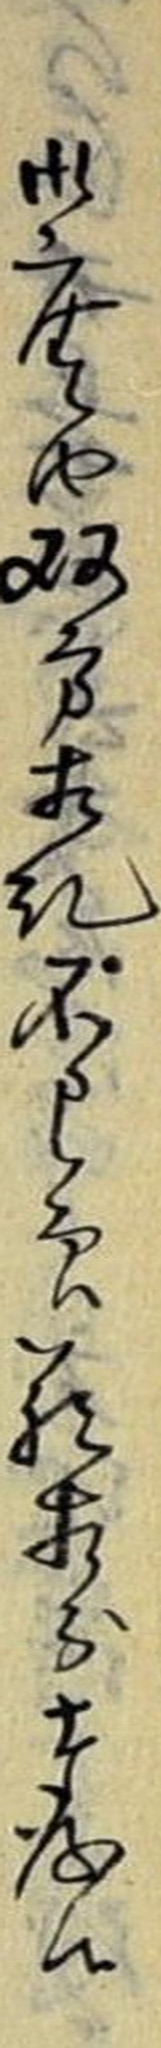御座候由双方相糺不申候而は難相分奉存候
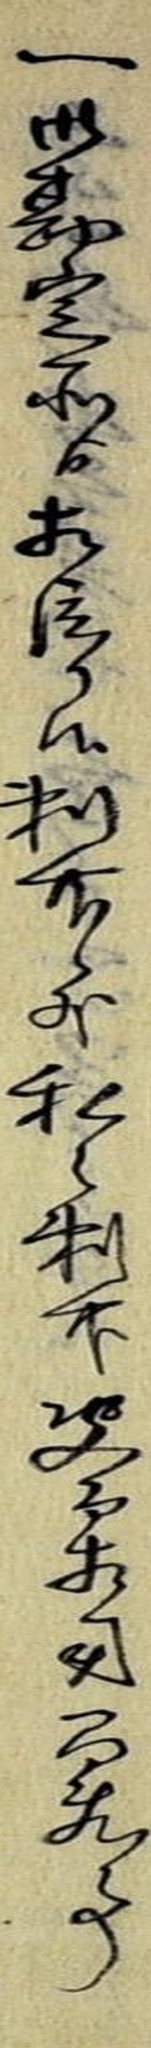一御勘定所ゟ相渡り候刺竹之外私之刺竹決而相用間敷事
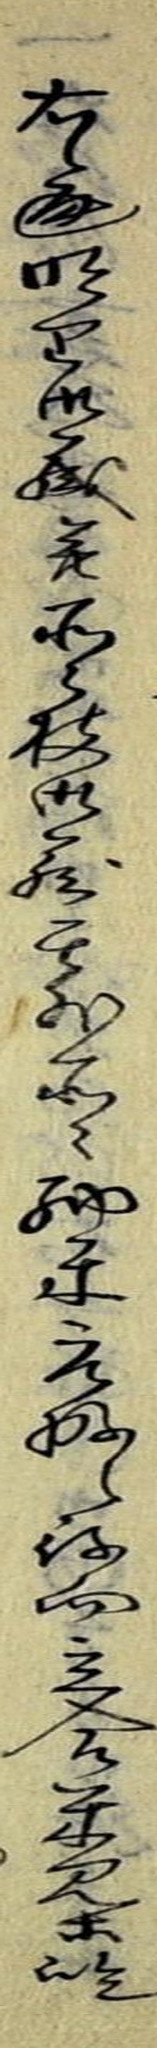右之通明里御蔵并所々枝御蔵其外所々納米取扱候役向立合米見等吃
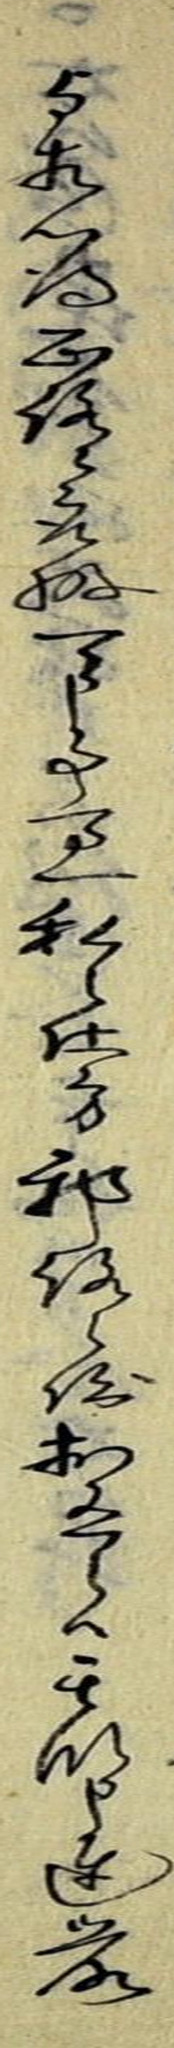と相心得正路に取扱可申事万一私之仕方邪路之儀於有之は其段申達厳
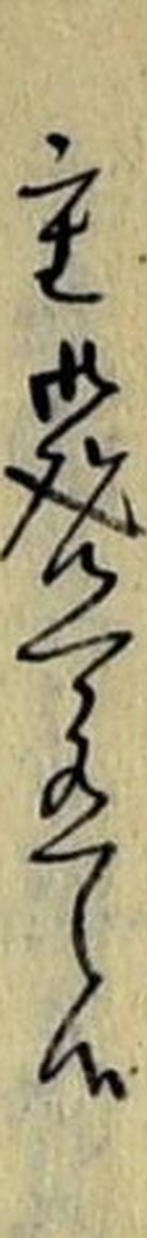重御咎可有之候
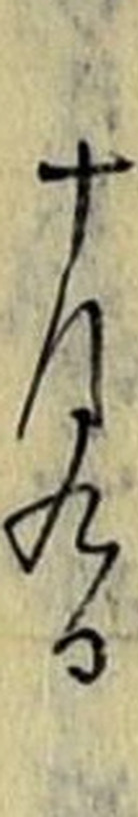十月九日
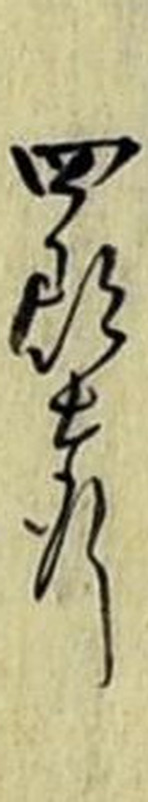四郡奉行
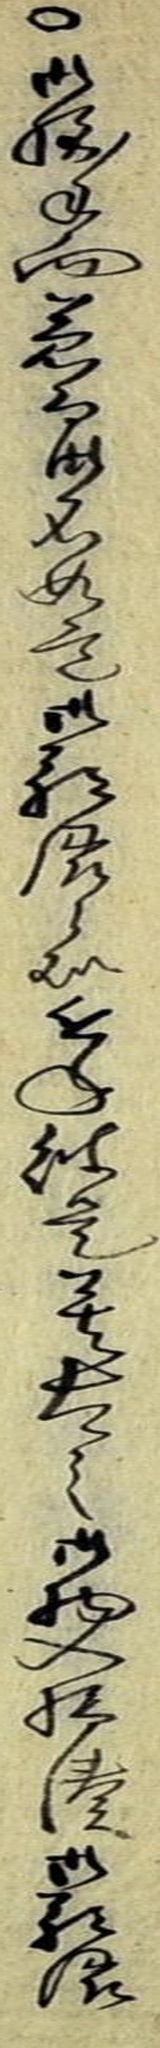○御勝手向兼而御不如意御難渋之処近年彼是莫太之御物入指湊御難渋
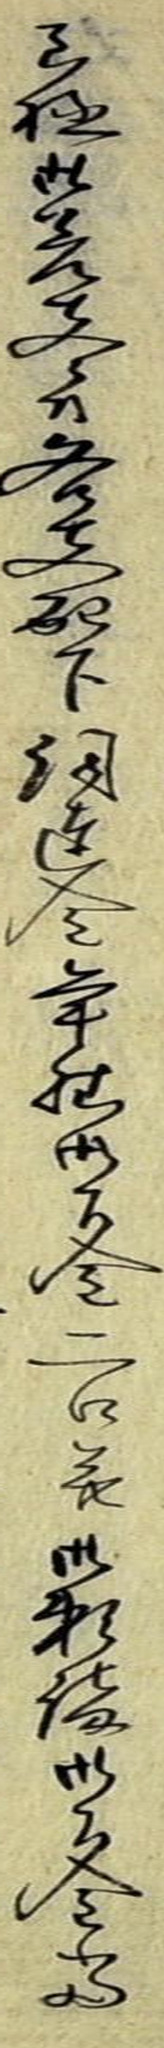至極御差支に付各支配下調達金年賦御下金二口并御頼講御下金当
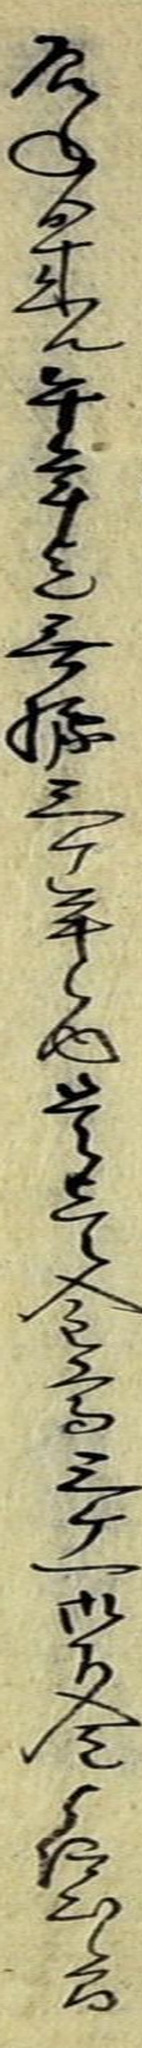辰年ゟ来ル午年迄無拠三ヶ年之内是迄之金高三ヶ一御下金被仰出候間
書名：命令之部 四
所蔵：福井県文書館 Fukui Prefectural Archives
